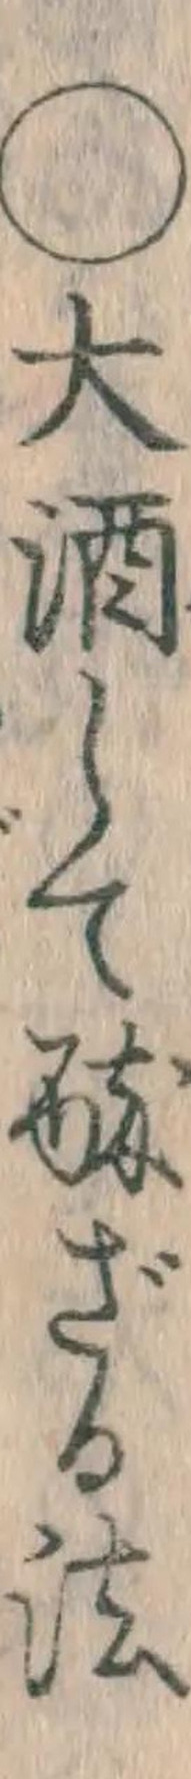○大酒して酔ざる法
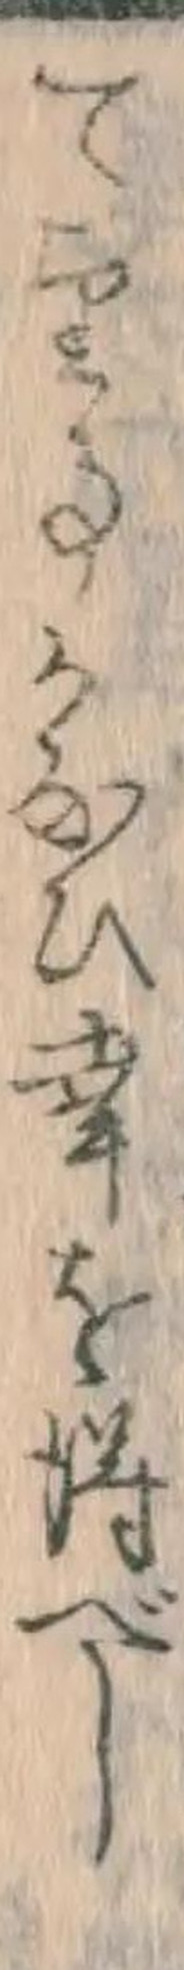て望事かなひ幸を得べし
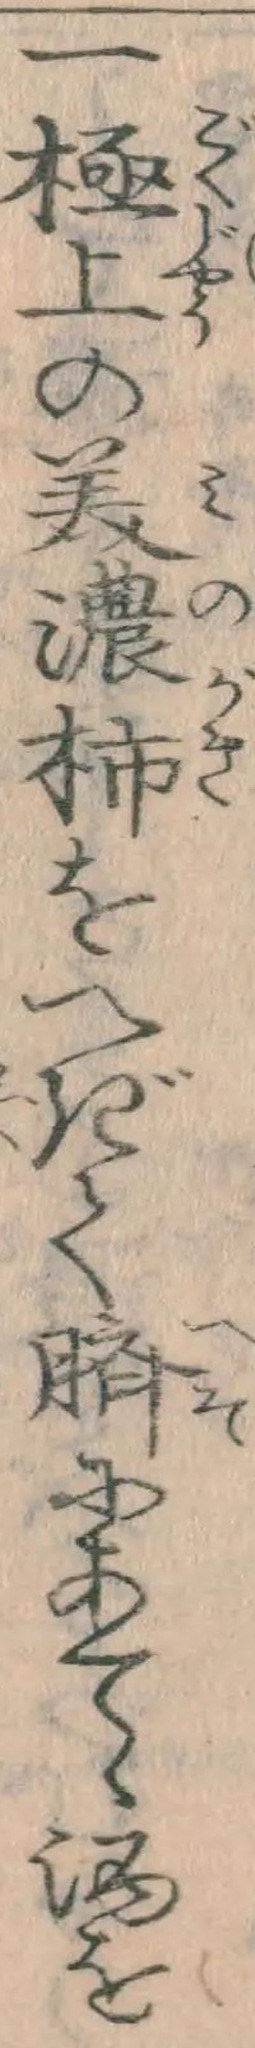一極上の美濃柿をへぎて臍にあてゝ酒を
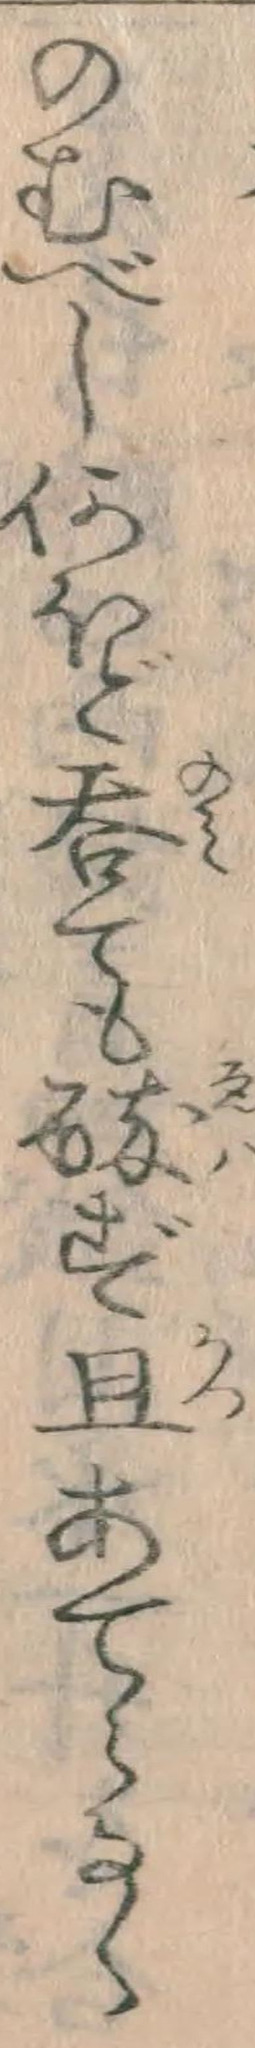のむべし何ほど呑ても酔ず且あてらるゝ
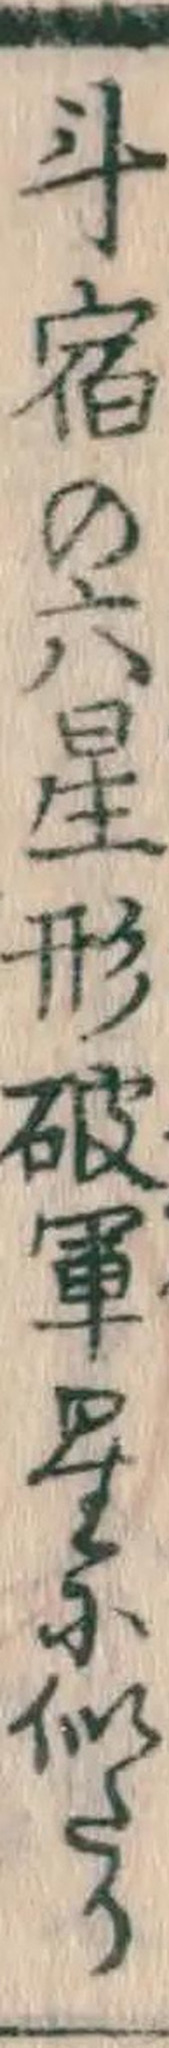斗宿の六星形破軍星に似たり
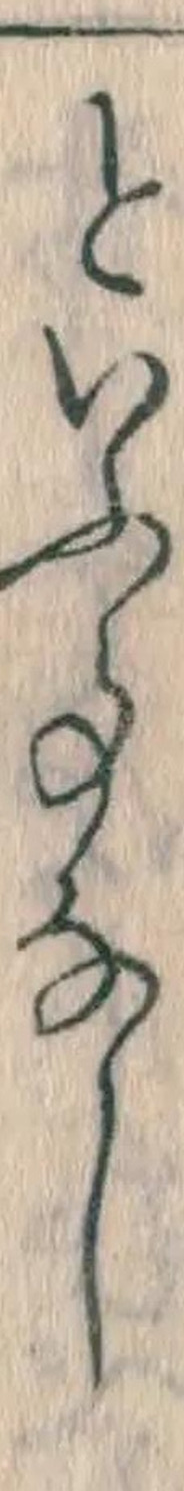といふ事なし
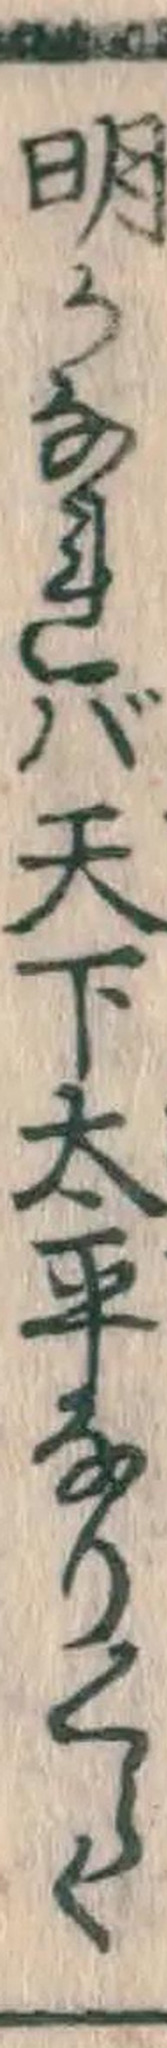明かなれば天下太平なりくらく
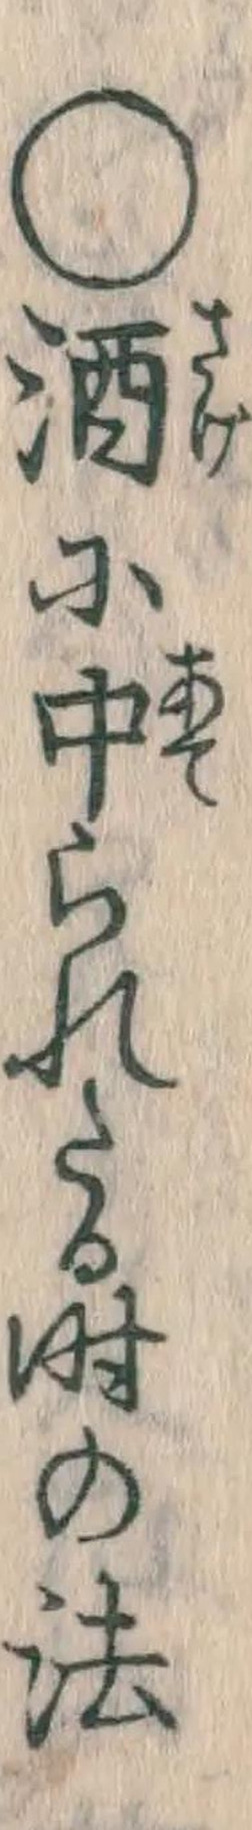○酒に中られたる時の法
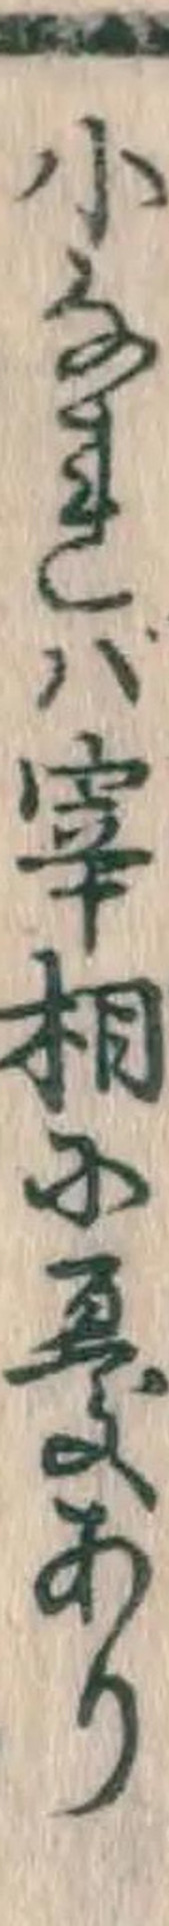小なれば宰相に憂あり
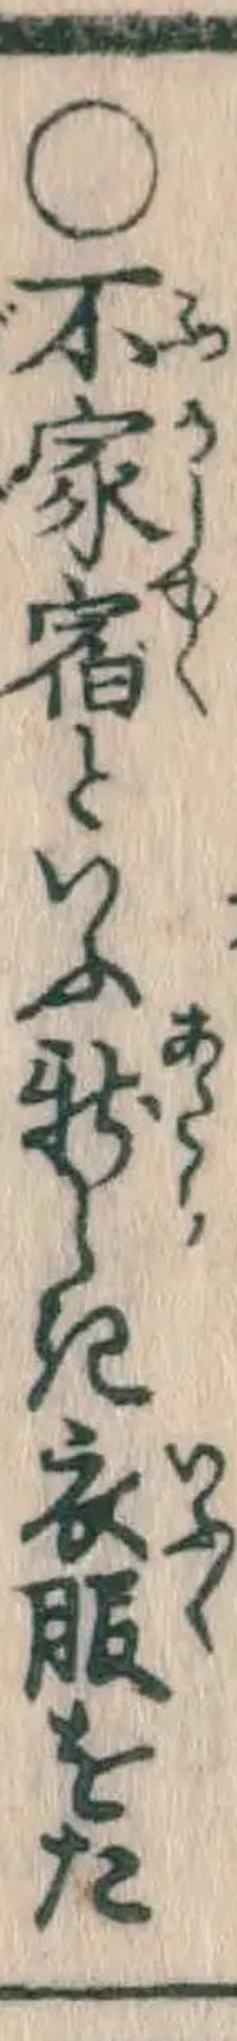○不家宿といふ新しき衣服をた
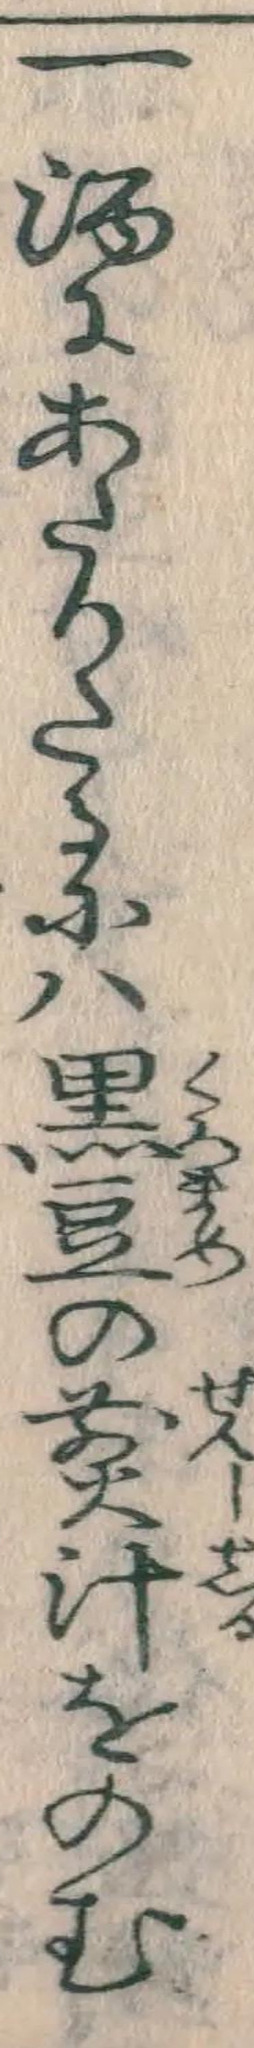一酒にあたりたるには黒豆の煎汁をのむ
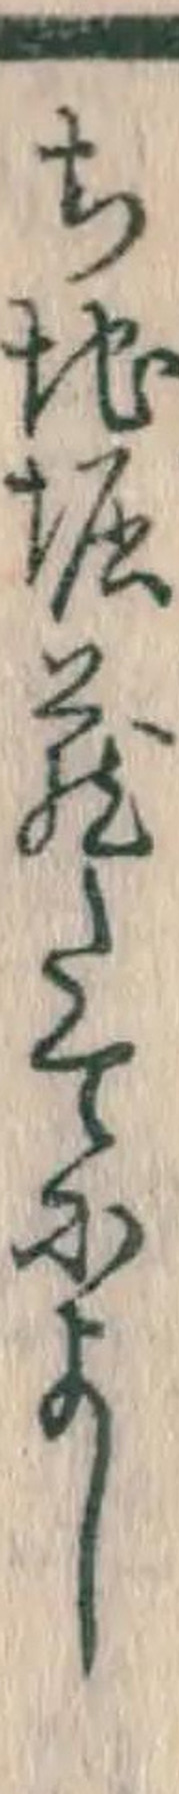ち地掘蔵たてによし
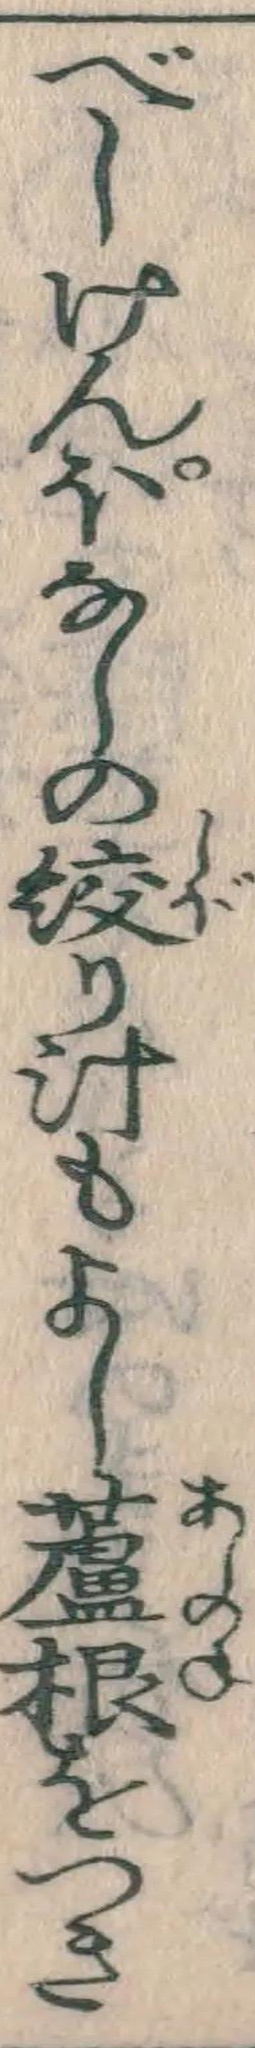べしけんぽなしの絞り汁もよし蘆根をつき
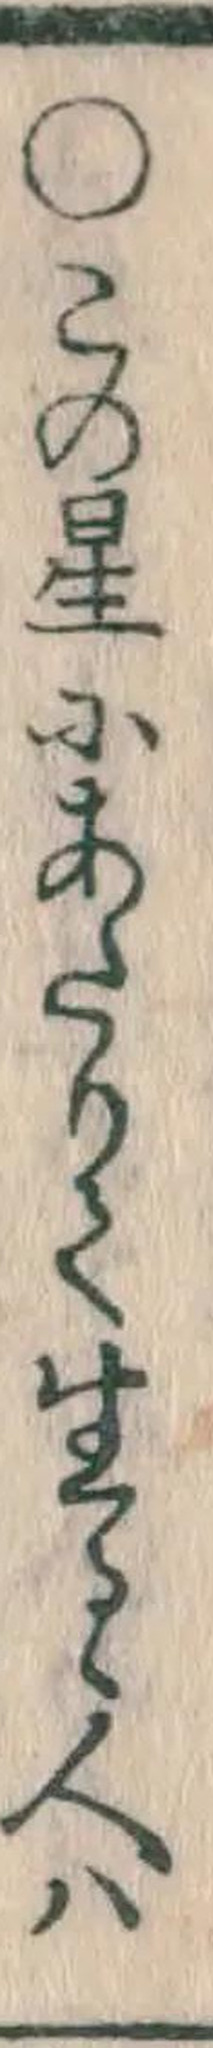○この星にあたりて生るゝ人は
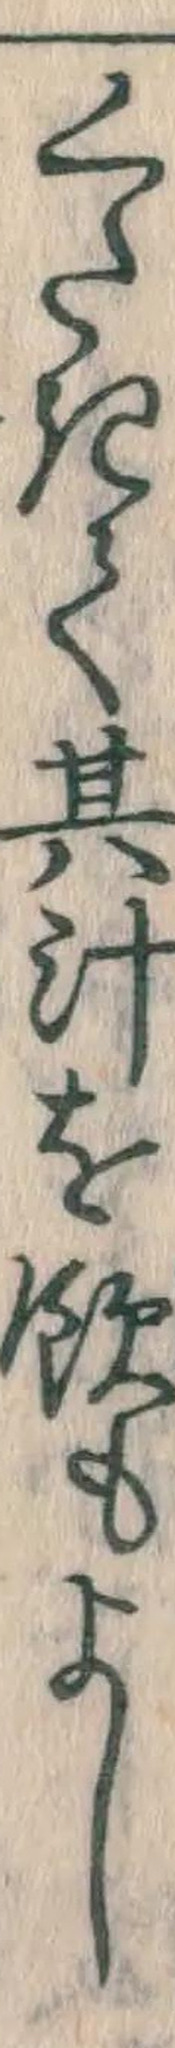くたきて其汁を飲もよし
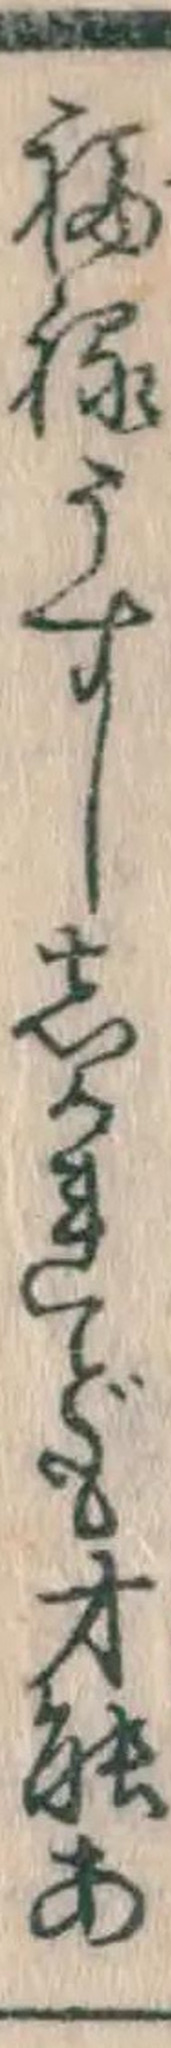福禄うすししかれども才能あ
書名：広益秘事大全 3巻. [2]
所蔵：国立国会図書館 National Diet Library, JAPAN
